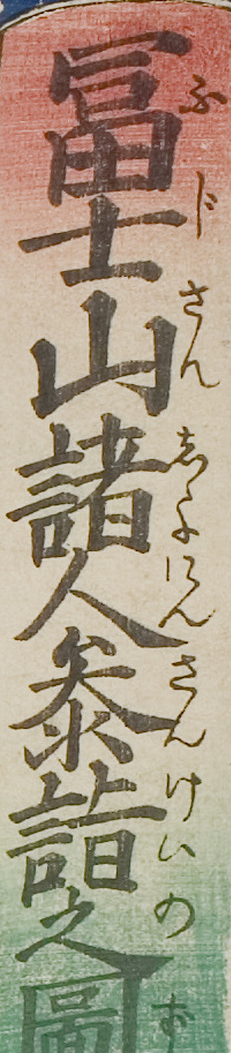冨士山諸人参詣之図
